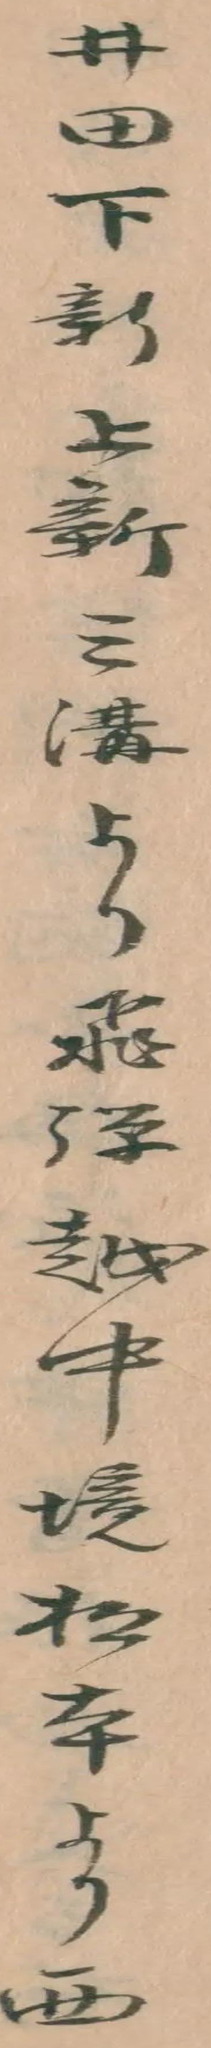井田下新上新下三溝より飛驒越中境松本より西

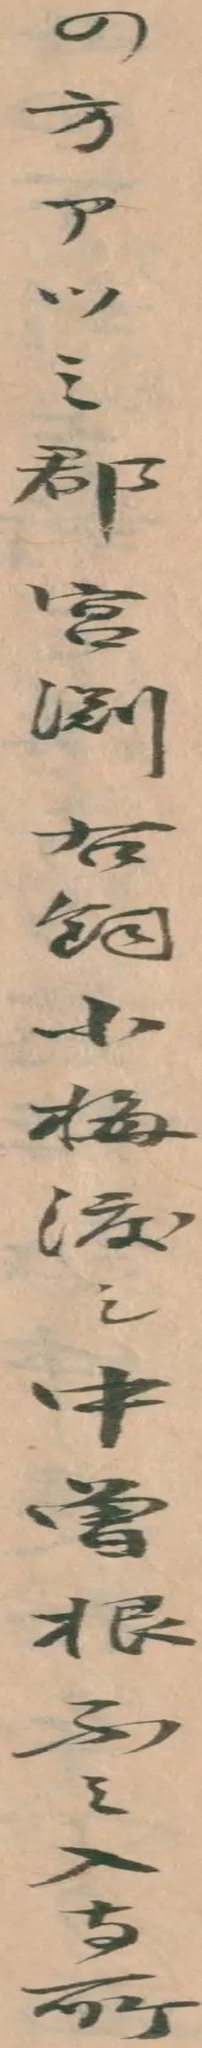の方アズミ郡宮淵右飼小梅渡シ中曽根ふミ入寺
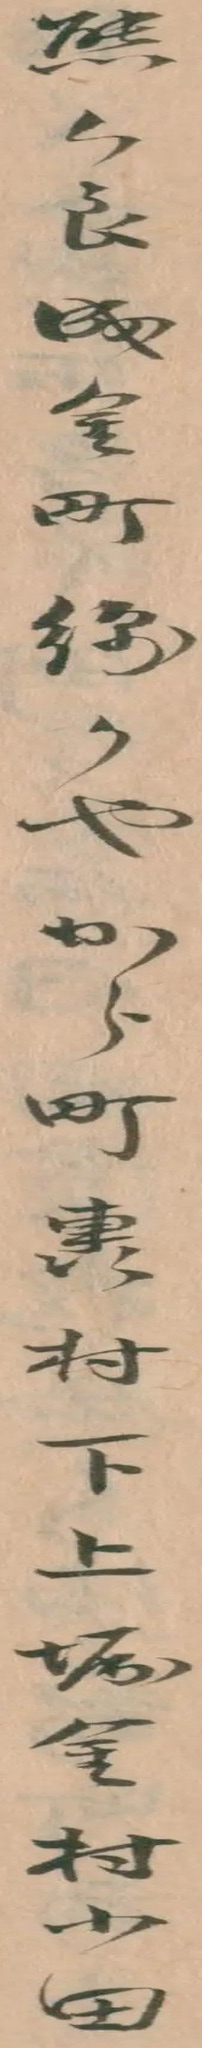熊くら成金町織りやから町轟村下上堀金村小田
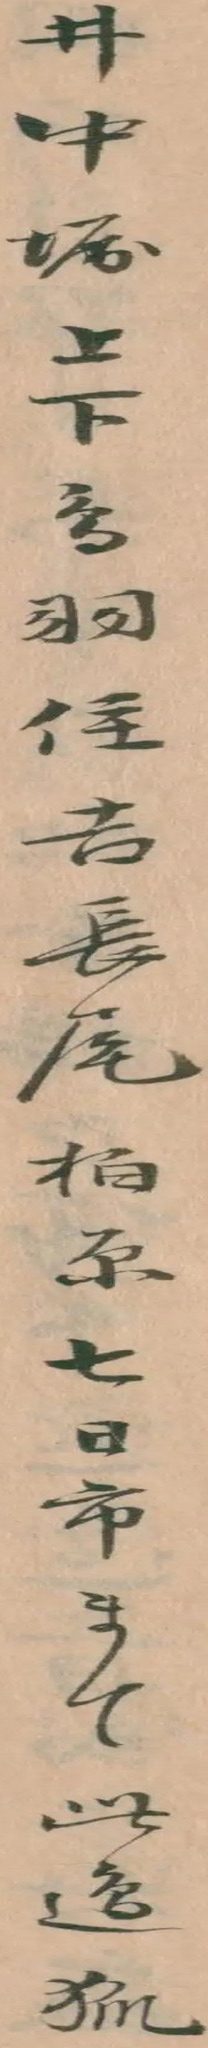井中塚上下鳥羽住吉長尾柏原七日市まて此辺狐
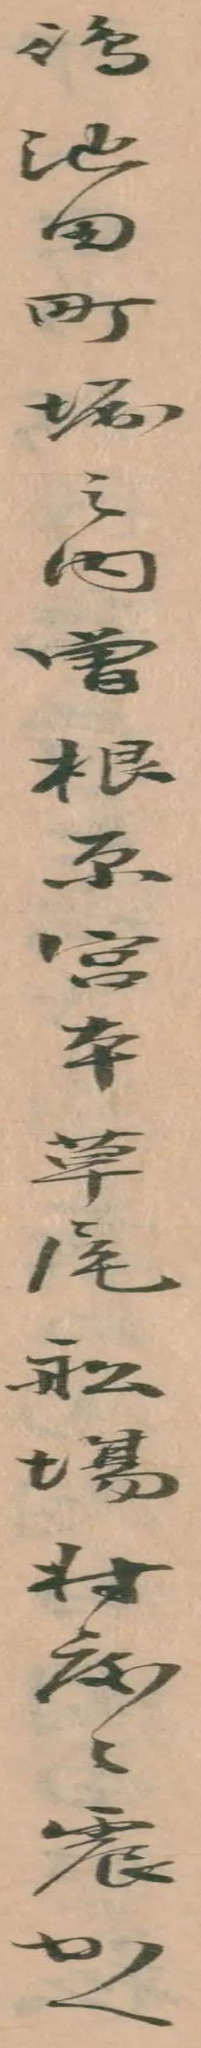嶋池田町堀之内曽根原宮本草尾船場村度々震かへ
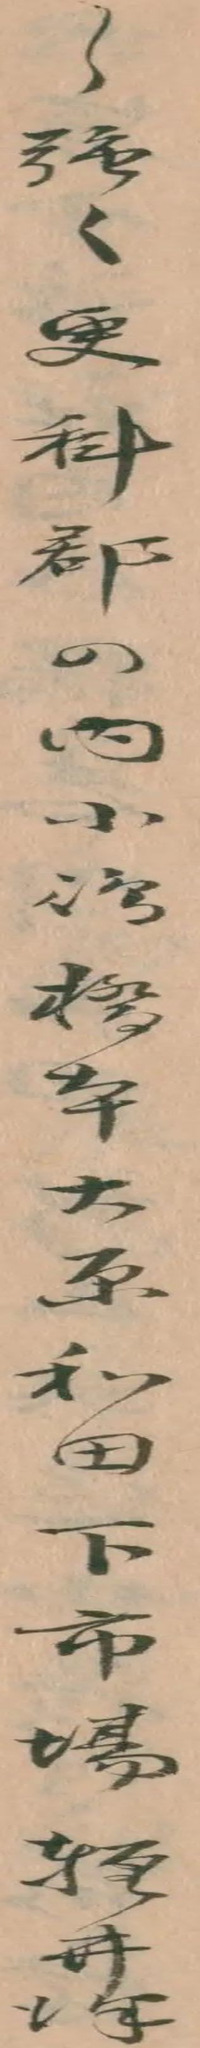し強く更科郡の内小嶋橋本大原和田下市場軽井沢
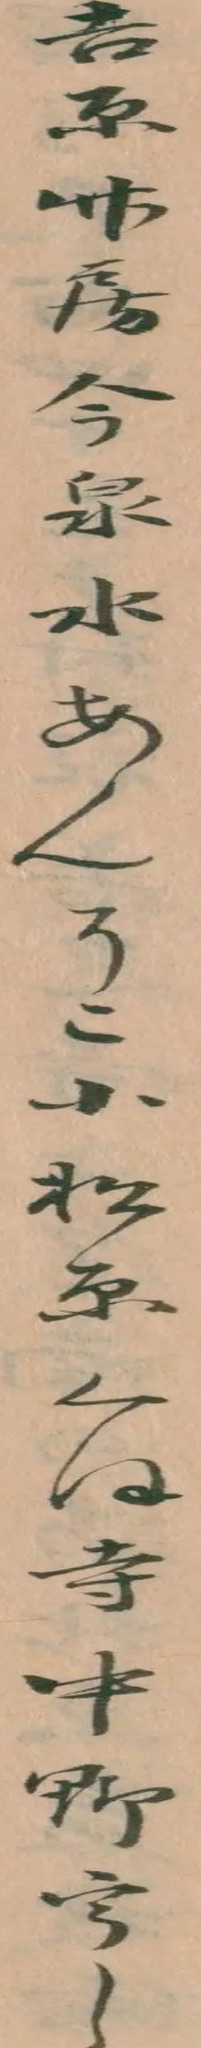吉原竹房今泉水あんばこ小松原く同寺中野うろ
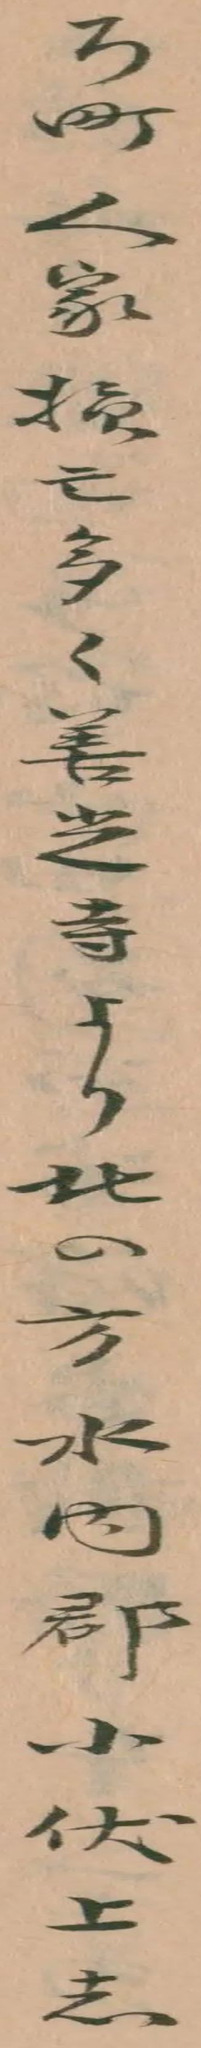町人家損亡多く善光寺より北の方水内郡小伏上し
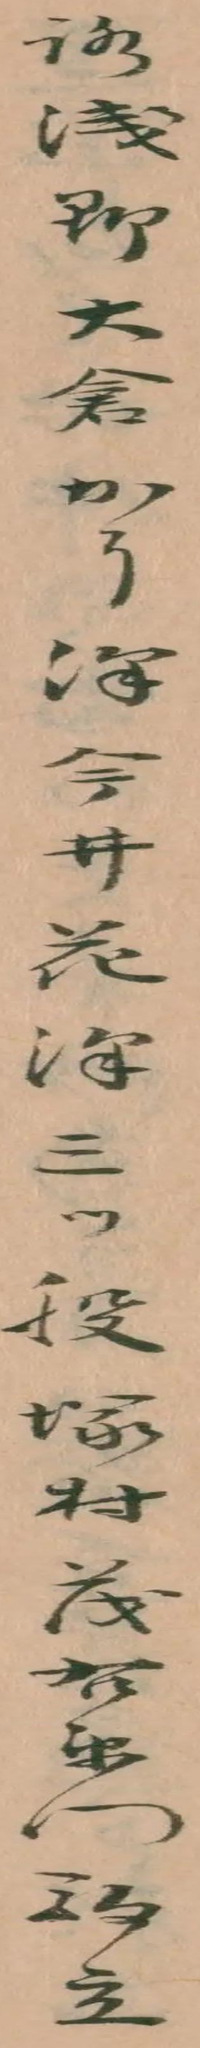ろ浅野大倉かに沢今井花沢三ツ股塚村義右衛門駒立
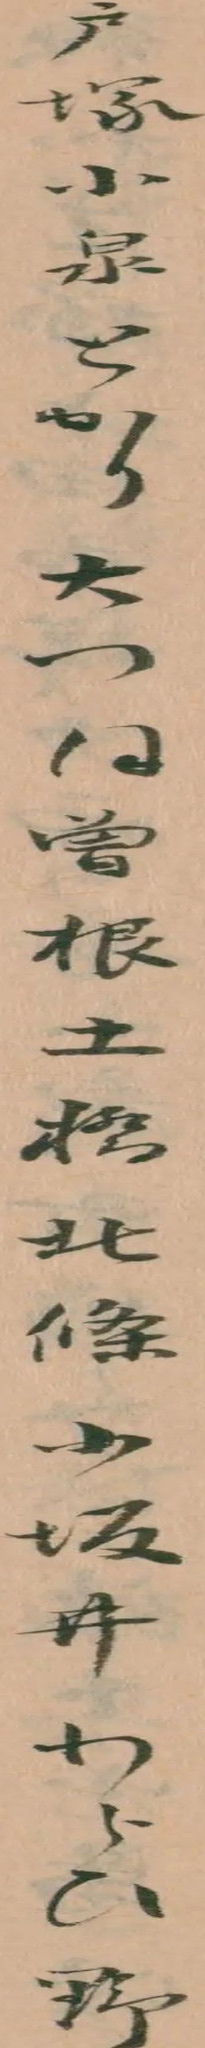戸塚小泉とがり大つぼ曽根土橋北条小坂井わらひ野
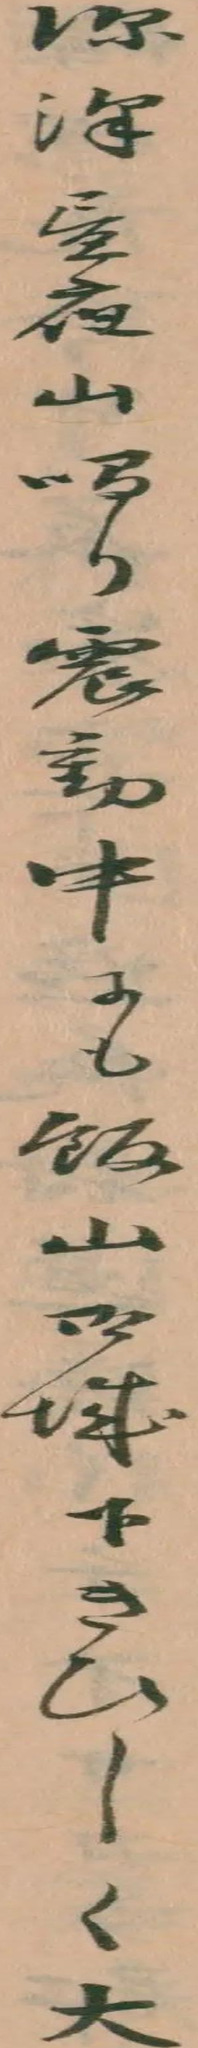源沢昼夜山鳴り震動中にも飯山御城下きびしく大
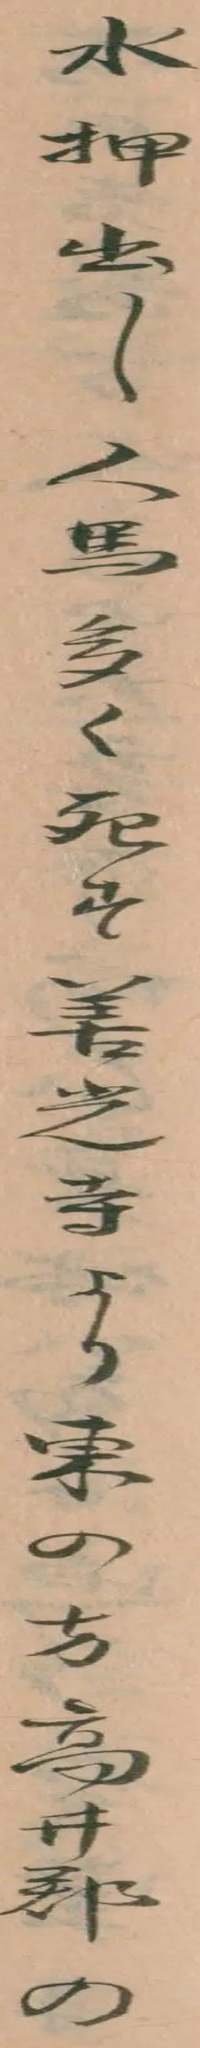水押出し人馬多死す善光寺より東の方髙井郡の
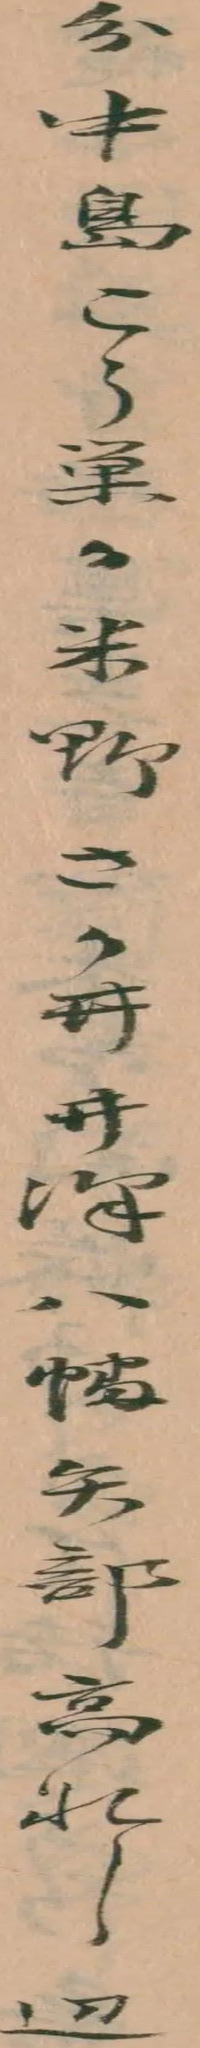分中島こう巣か米野さかい井沢八幡矢部高なし辺
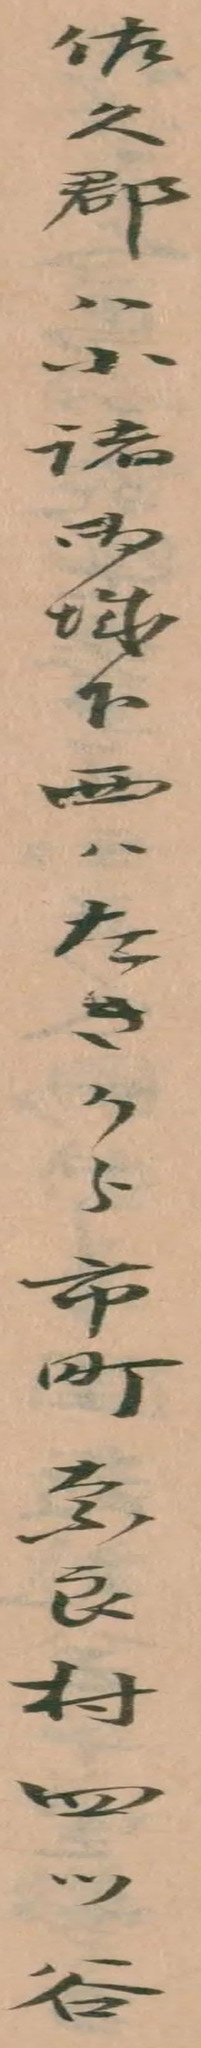佐久郡ハ小諸御城下西ハたきハら市町市町奈良村四ッ谷
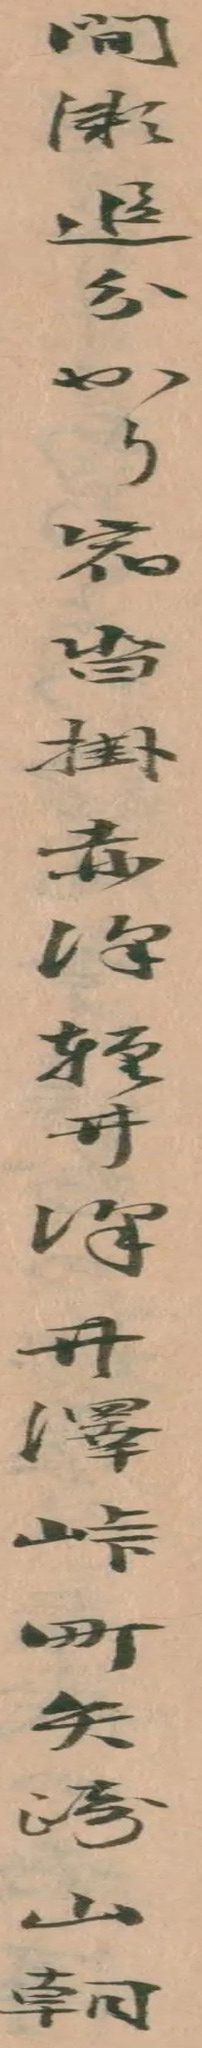間瀬追分かり宿沓掛赤沢軽井沢井沢峠町矢崎山朝
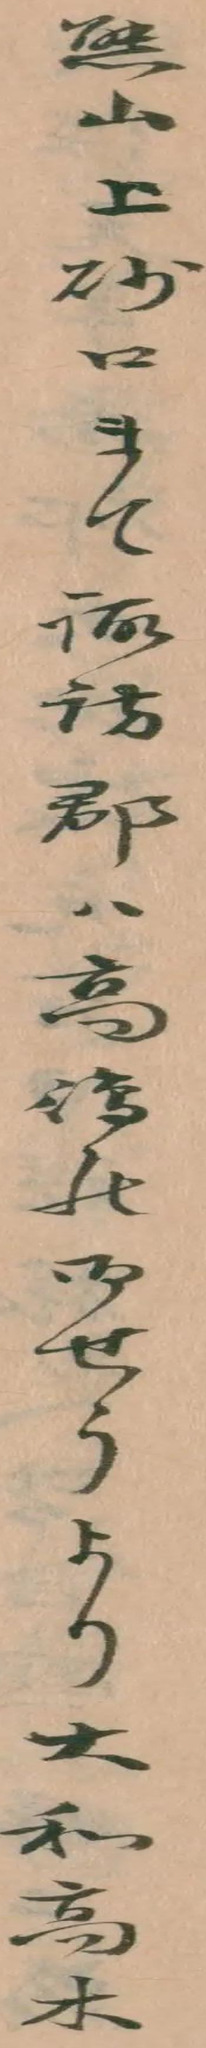熊山上砂口まて諏訪郡ハ高嶋の御せうより大和高木
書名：地災撮要. 巻3(地震之部)-巻4(噴火之部)
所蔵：国立国会図書館 National Diet Library, JAPAN
